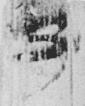子
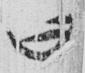曰
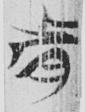前（延）
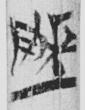陵
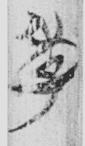季
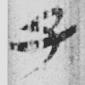子
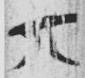亓（其）
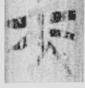天
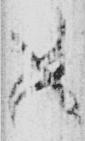民
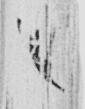也
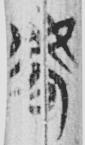○（乎）
